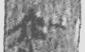六
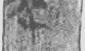十
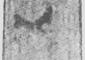五
